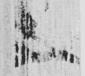之
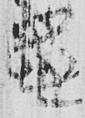○（謀）
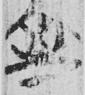室
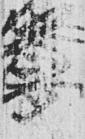○（且）
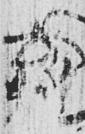弃
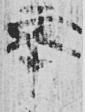不
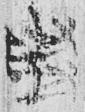○（墮）
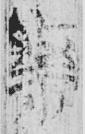祭
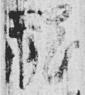祀
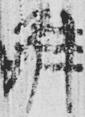唯
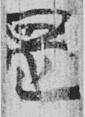是
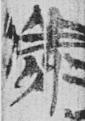備（服）
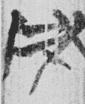凡
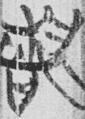若
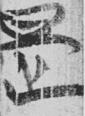是
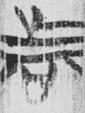者
